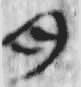月
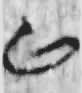㠯（以）
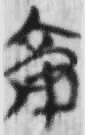○（就）
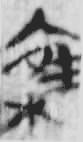○（集）
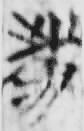歲（歲）
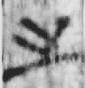之
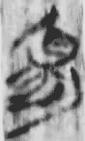○（夏）
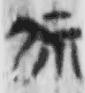𫵖
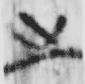之
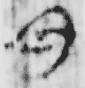月
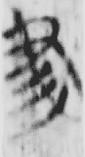○（盡）
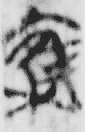○（集）
